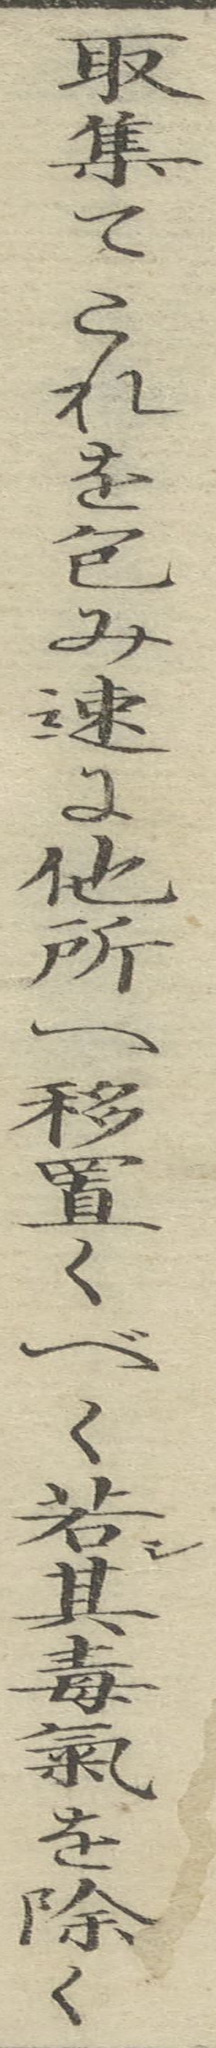取集てこれを包み速に他所へ移置くべし若其毒氣を除く

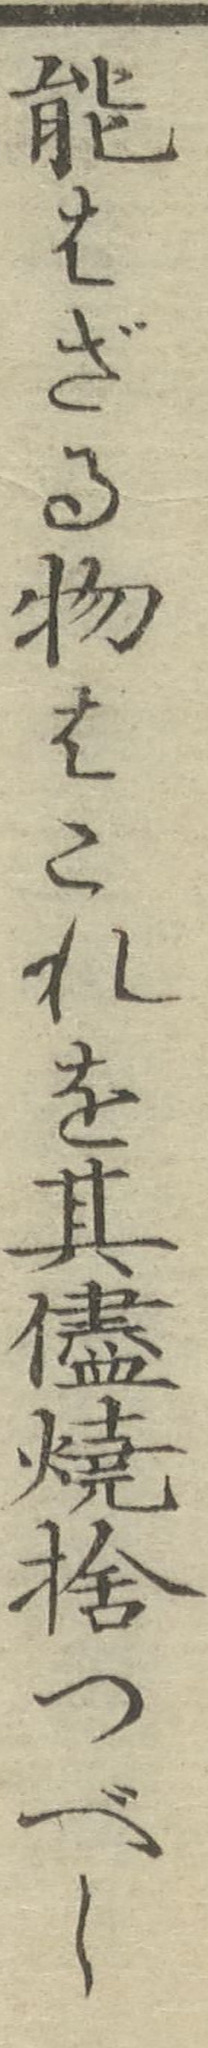能はざる物はこれを其儘焼捨つべし
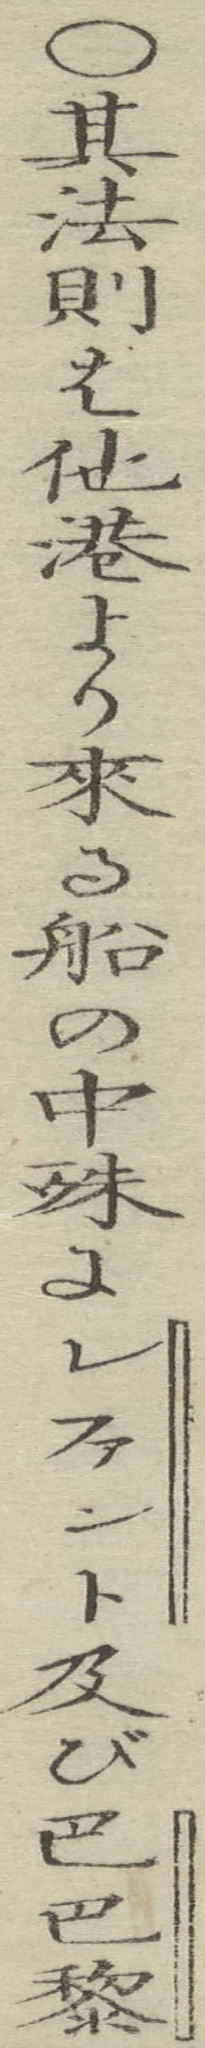〇其法則は他港より來る船の中殊にレファレト及び巴巴黎
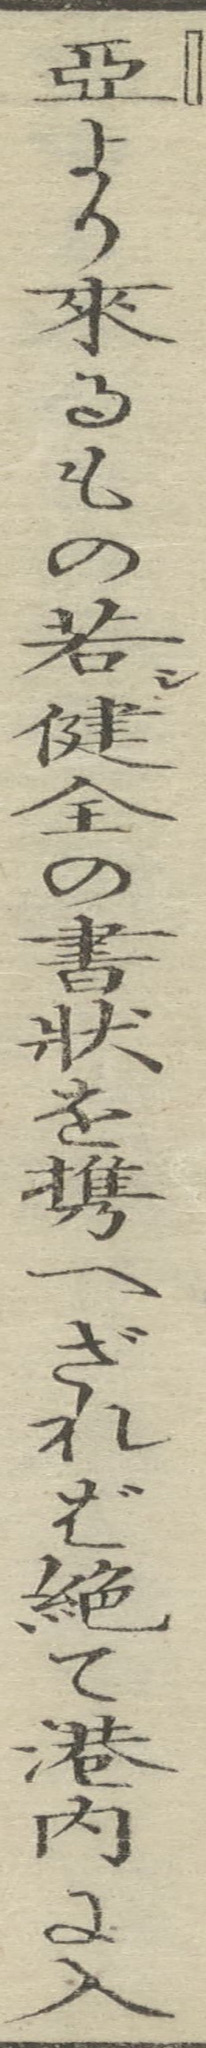亞より來るもの若健全の書状を携へざれば絶て港内に入
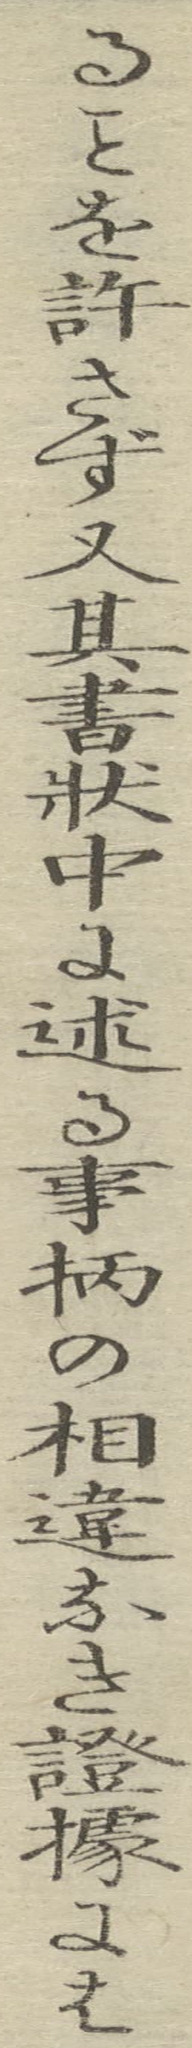ることを許さず又其書状中に述る事柄の相違なき證據には
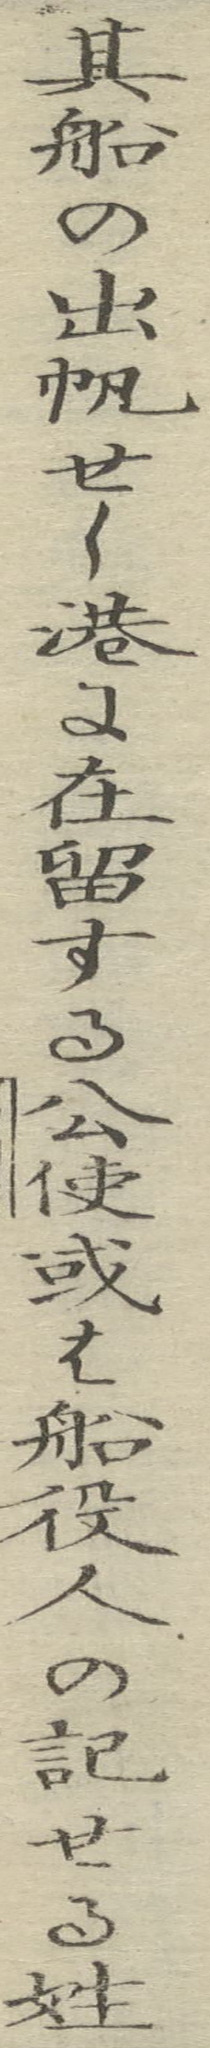其船の出帆せし港に在留する公使或は船役人の記せる姓
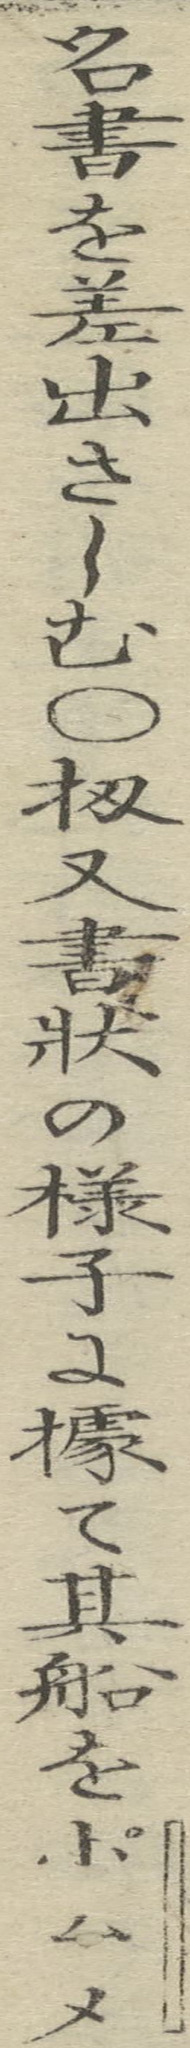名書を差出さしむ〇扨又書状の様子に據て其船をポムメ
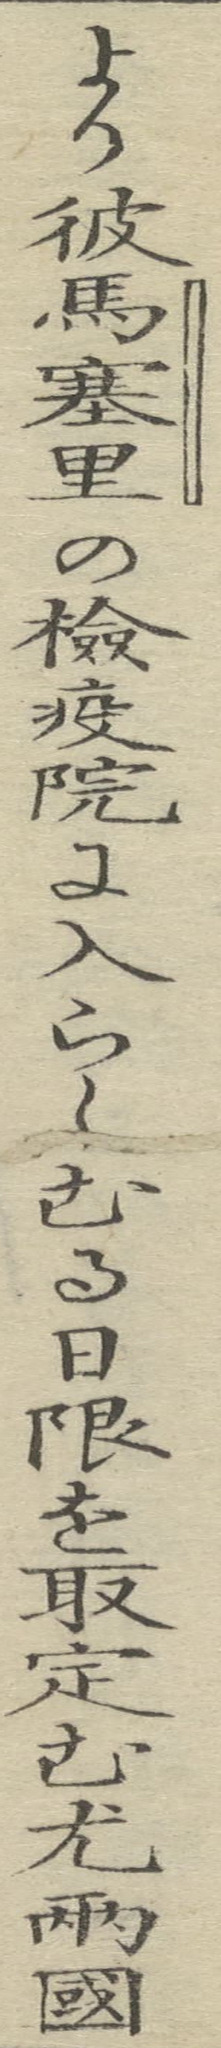より彼馬塞里の檢疫院に入らしむる日限を取定む尤両國
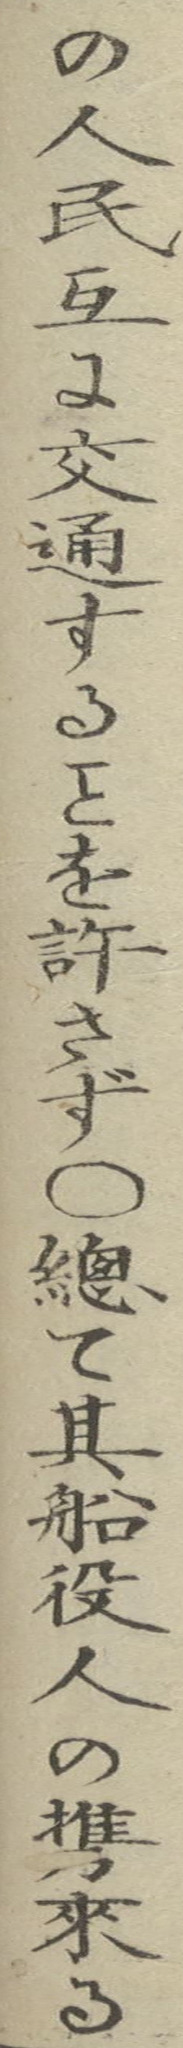の人民互に交通することを許さず〇總て其船役人の携來る
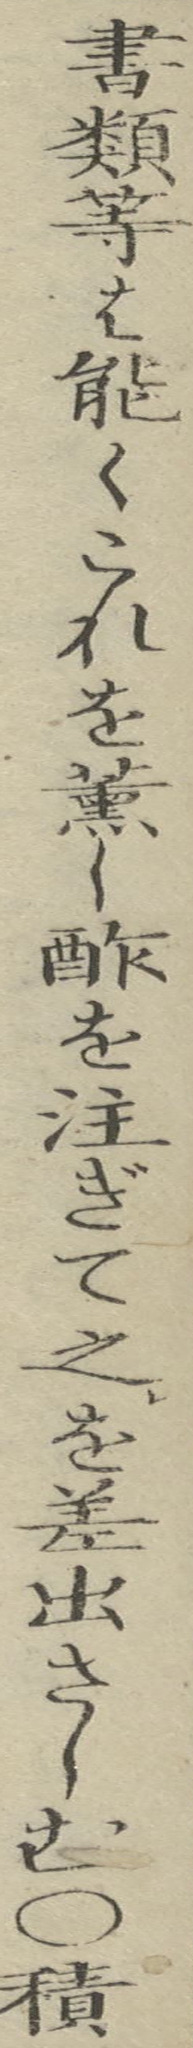書類等は能くこれを薫し酢を注ぎて之差出さしむ〇積
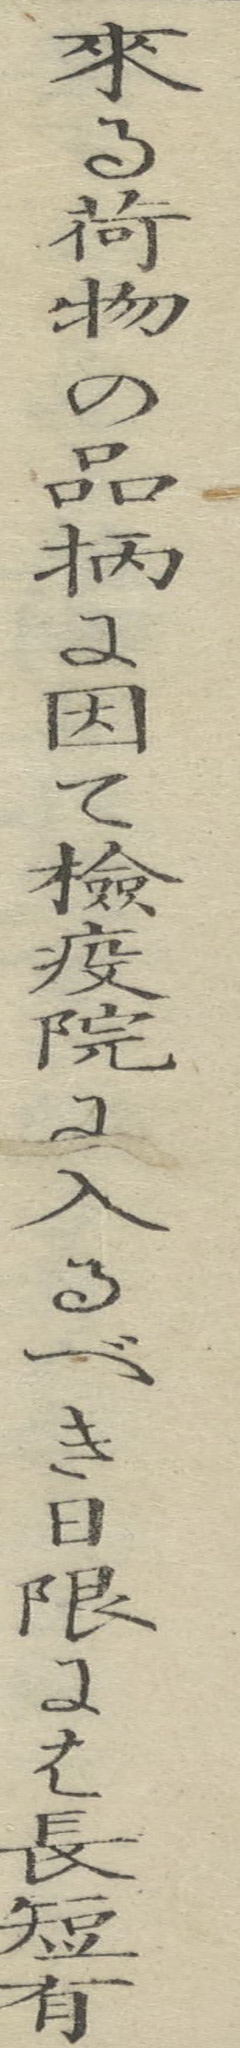來る荷物の品柄に因て檢疫院に入るべき日限には長短有
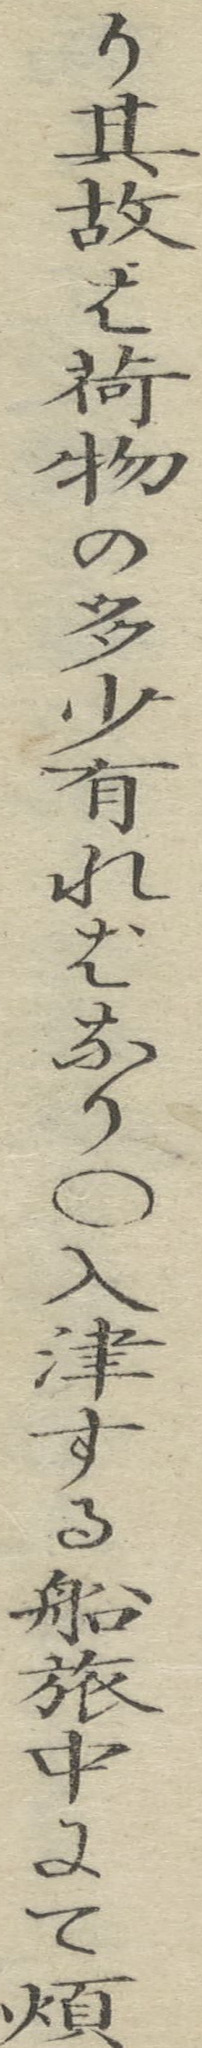り其故は荷物の多少有ればなり〇入津する船旅中にて煩
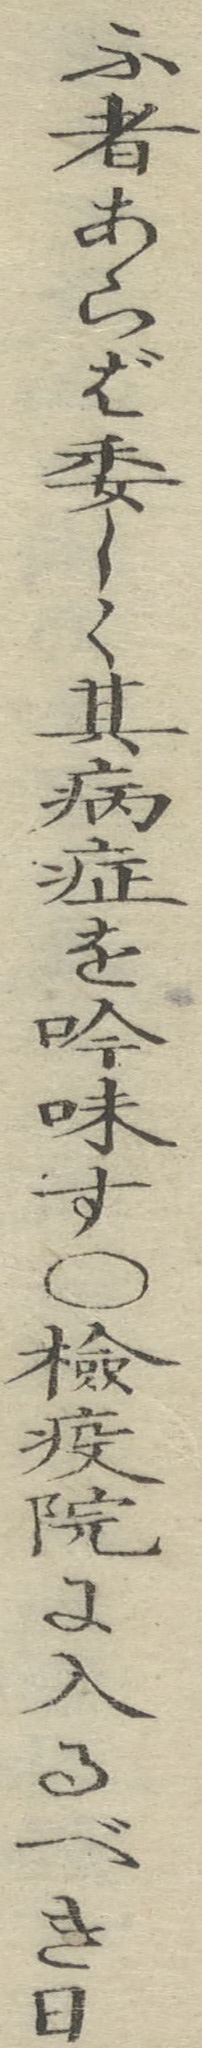ふ者あらば委しく其病症を吟味す〇檢疫院に入るべき日
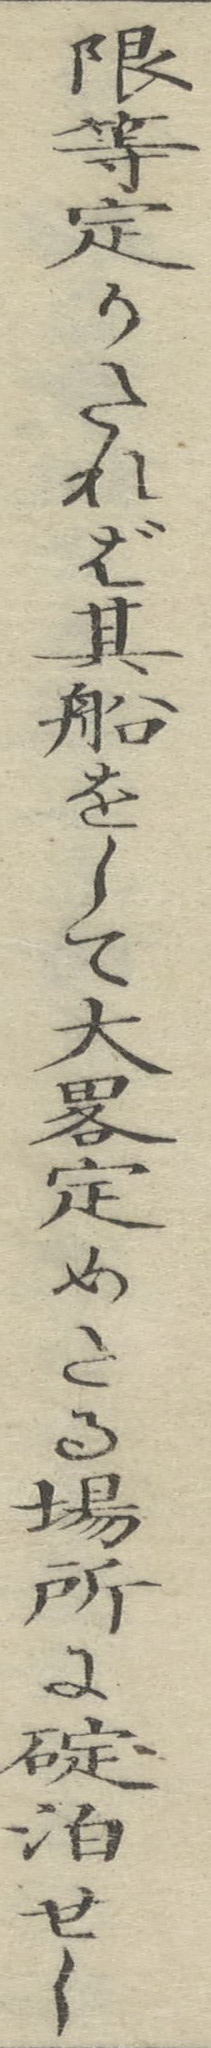限等定りされば其船をして大畧定めたる場所に碇泊せし
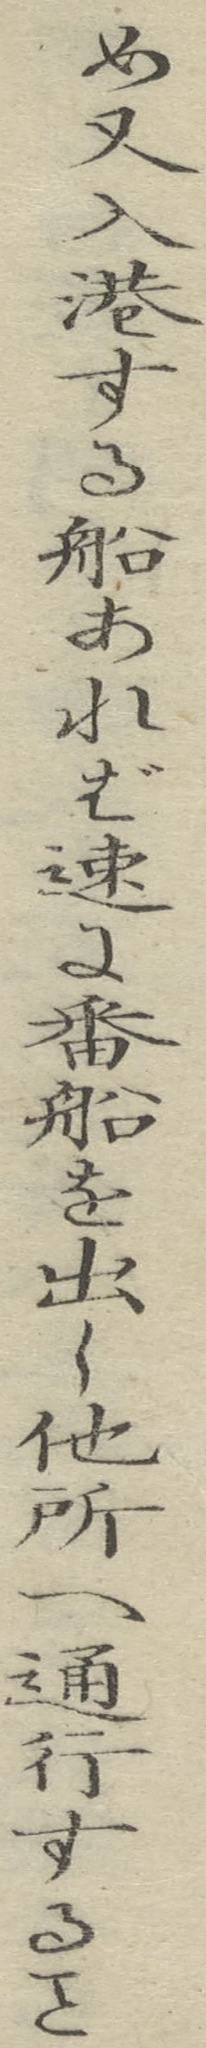め又入港する船あれば速に番船を出し他所へ通行すること
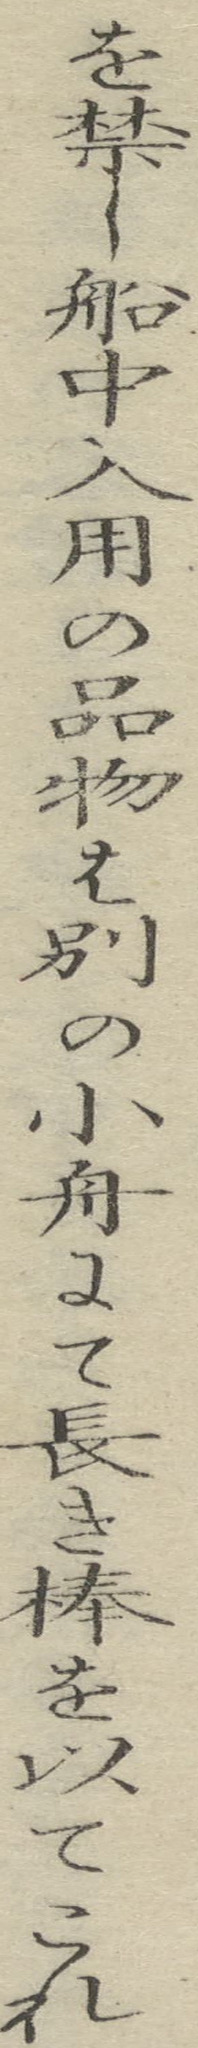を禁し船中入用の品物は別の小舟にて長き棒を以てこれ
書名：官版疫毒預防説　全
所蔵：東京大学総合図書館 General Library in the University of Tokyo, JAPAN
